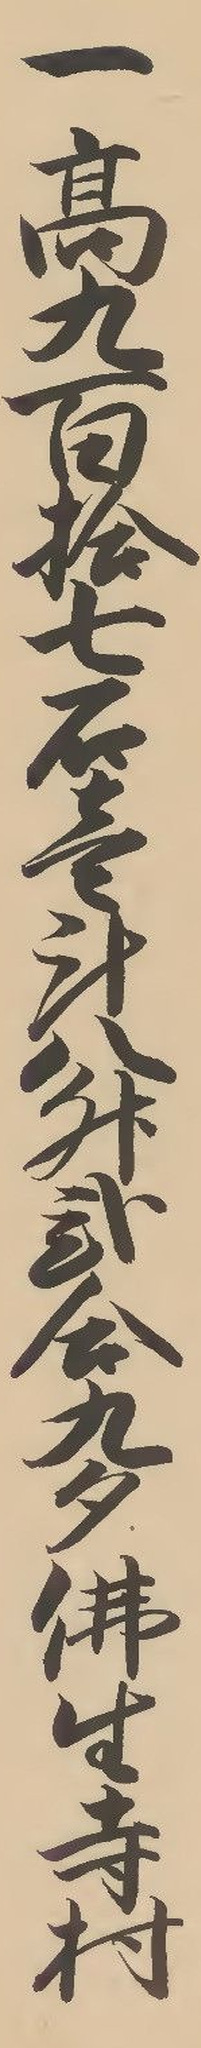一高九百拾七石壱斗八升弐合九勺仏生寺村

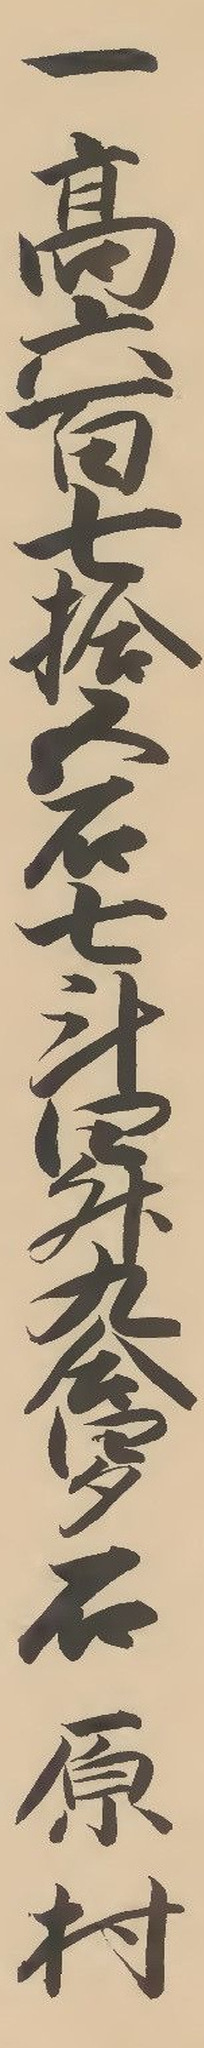一高六百七拾五石七斗四升九合四勺石原村
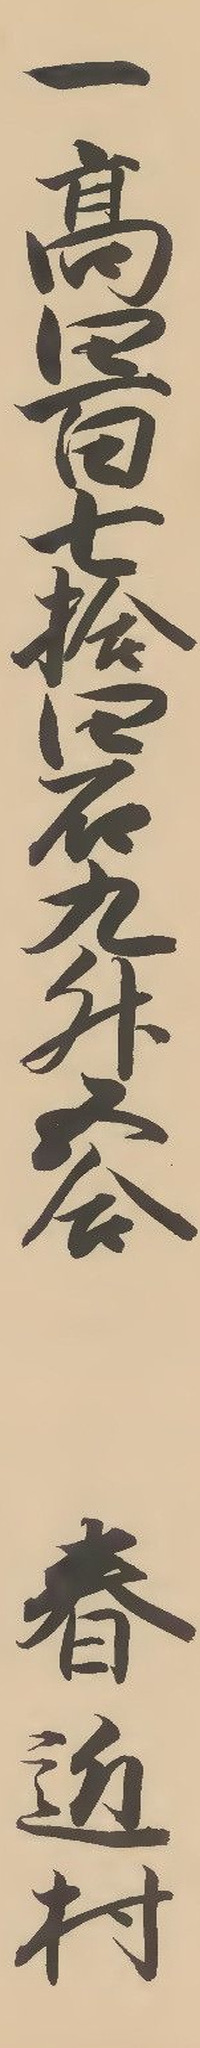一高四百七拾四石九升五合春近村
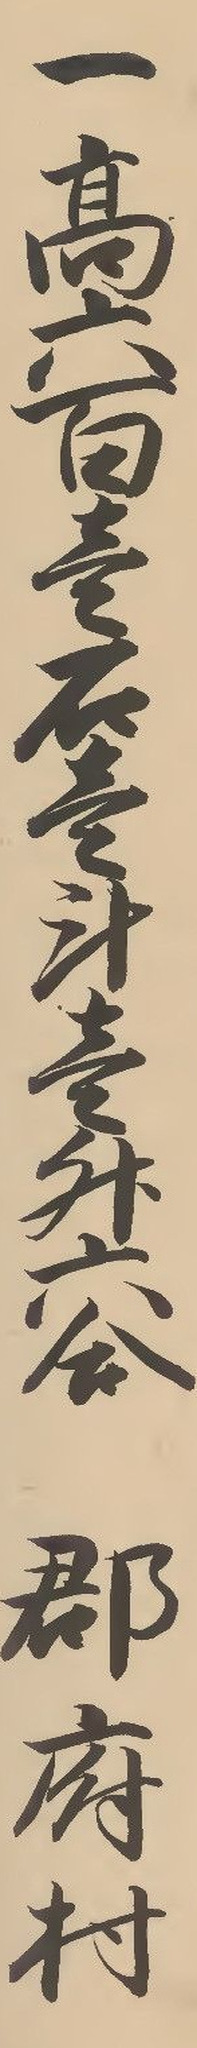一高六百壱石壱斗壱升六合郡府村
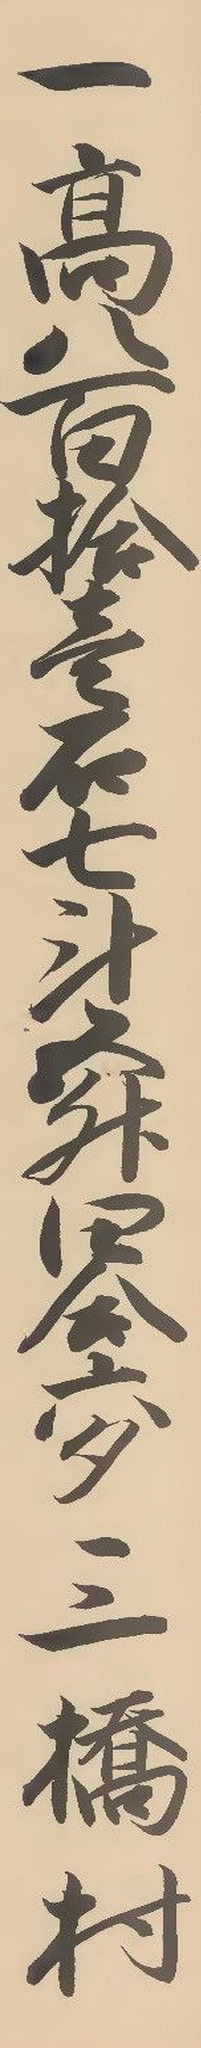一高八百拾壱石七斗五升四合六勺三橋村
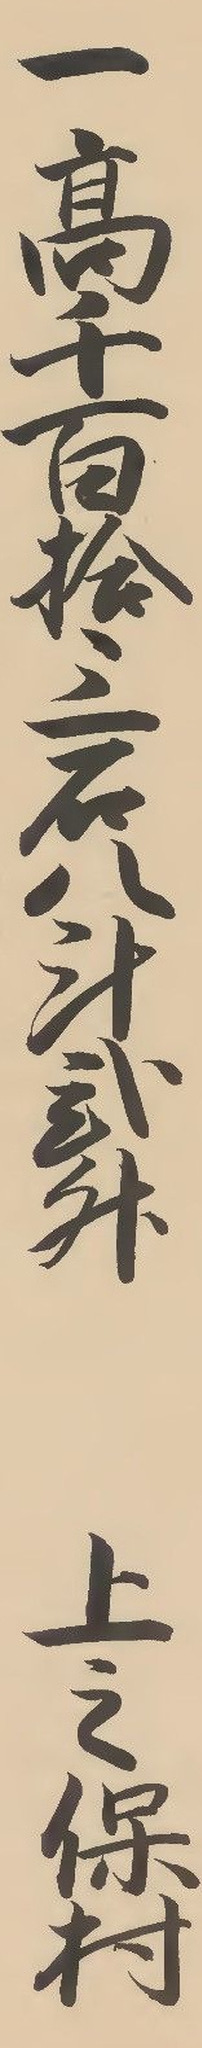一高千百拾三石八斗弐升上之保村
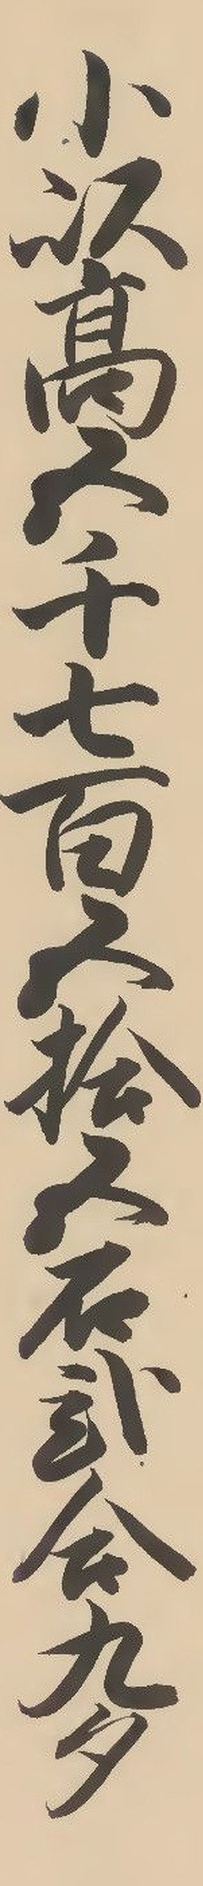小以高五千七百五拾五石弐合九勺

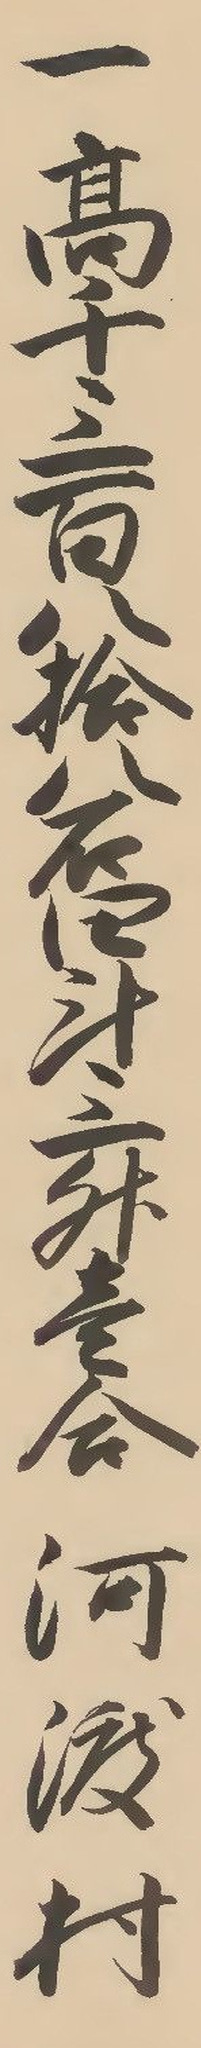一高千三百八拾八石四斗三升壱合河渡村
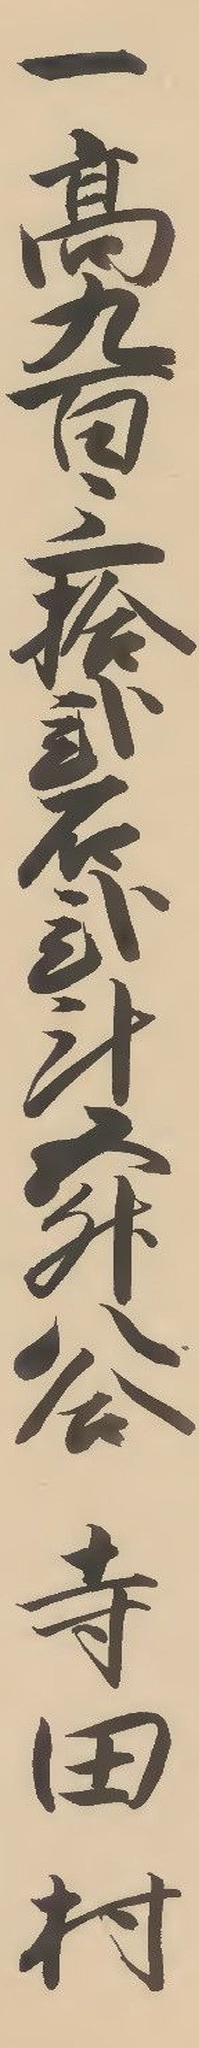一高九百三拾弐石弐斗五升八合寺田村
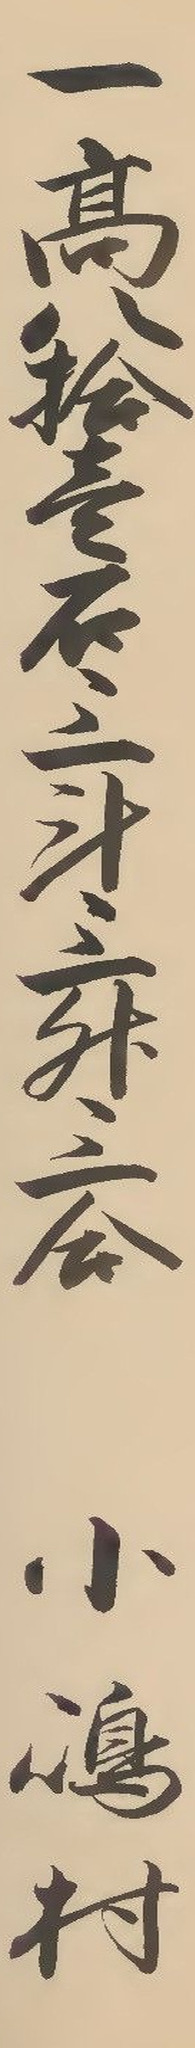一高八拾壱石三斗三升三合小島村
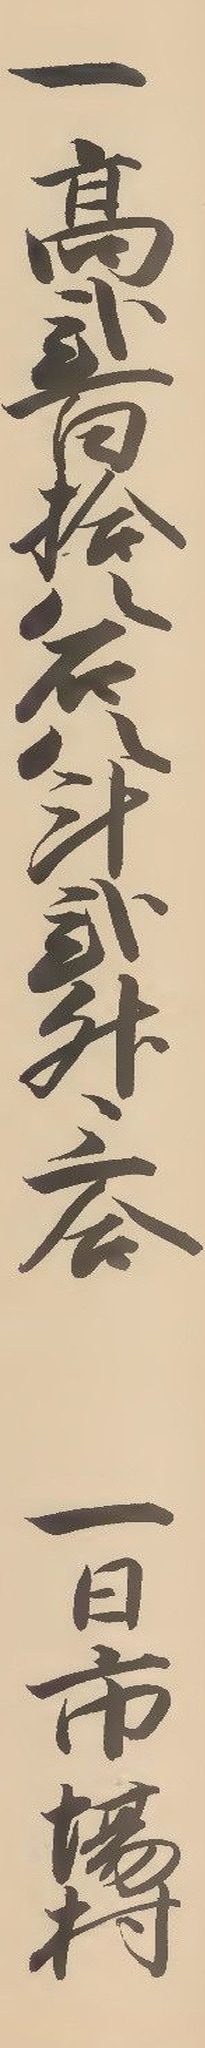一高弐百拾八石八斗弐升三合一日市場村
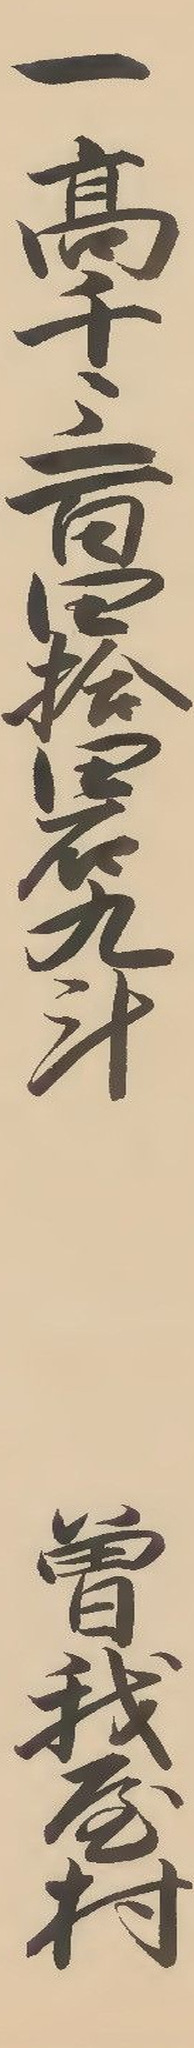一高千三百四拾四石九斗曽我屋村
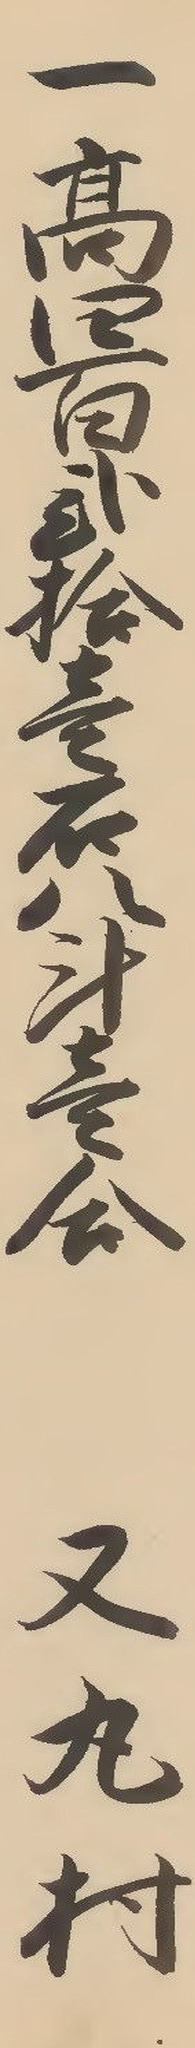一高四百弐拾壱石八斗壱合又丸村
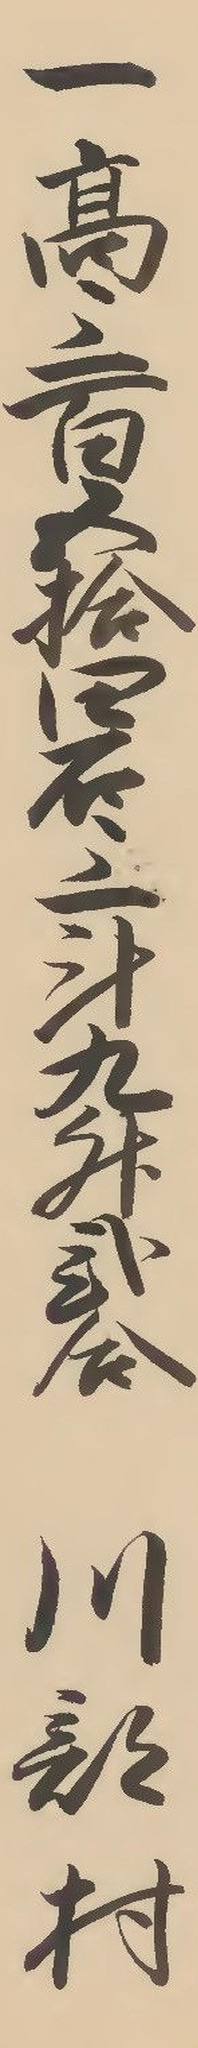一高三百五拾四石三斗九升弐合川部村

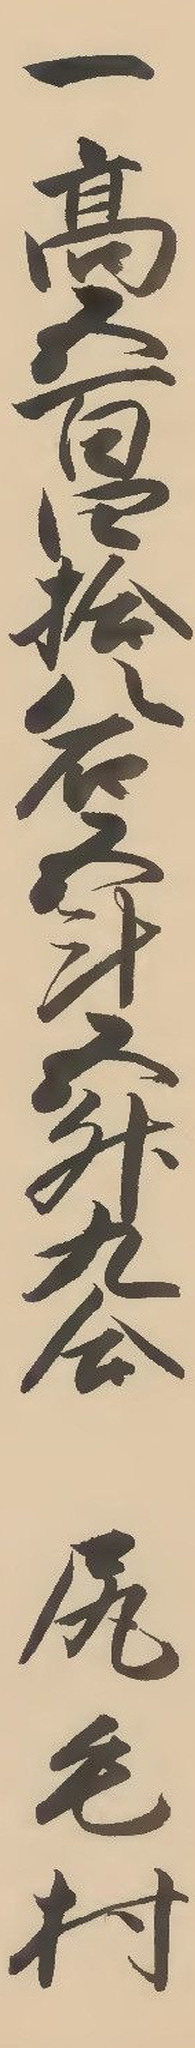一高五百四拾八石五斗五升九合尻毛村
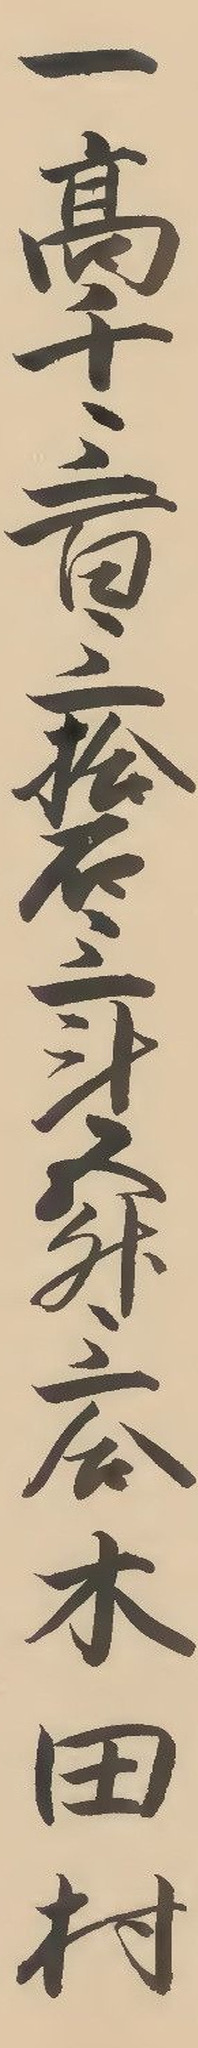一高千三百三拾石三斗五升三合木田村
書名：美濃国郷帳
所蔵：国立公文書館 National Archives of Japan
